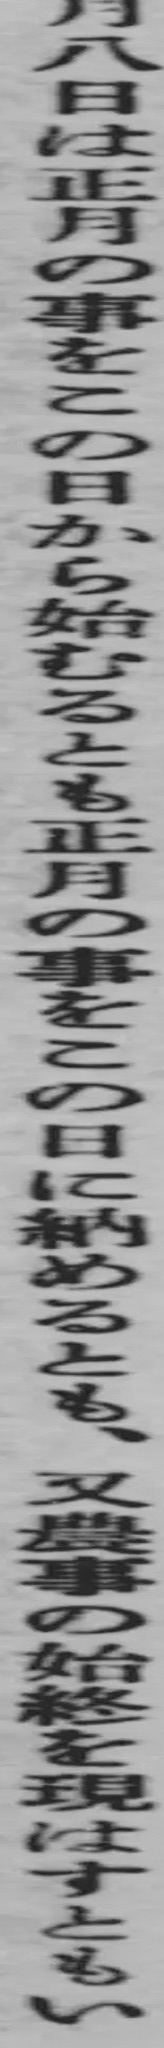月八日は正月の事をこの日から始むるとも正月の事をこの日に納めるとも、又農事の始終を現はすともい
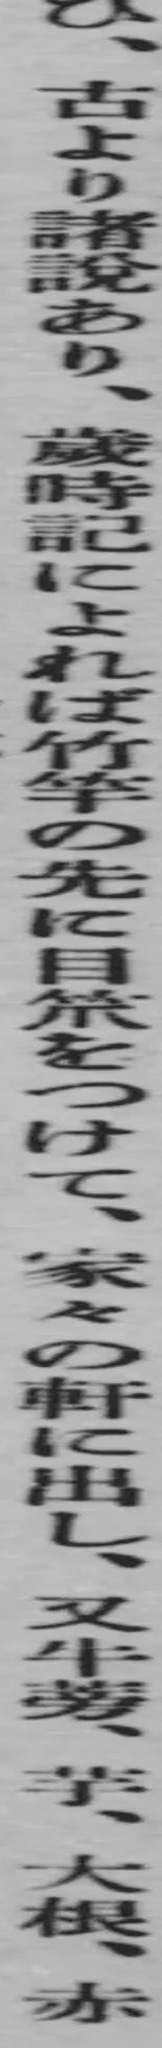ひ、古より諸説あり、歲時記によれば竹竿の先に目笊をつけて、家々の軒に出し、又牛蒡、芋、大根、赤
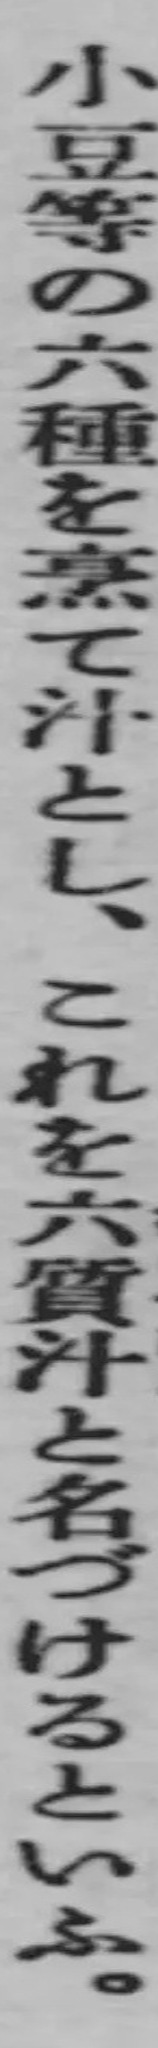小豆等の六種を烹て汁とし、これを六質汁と名づけるといふ。
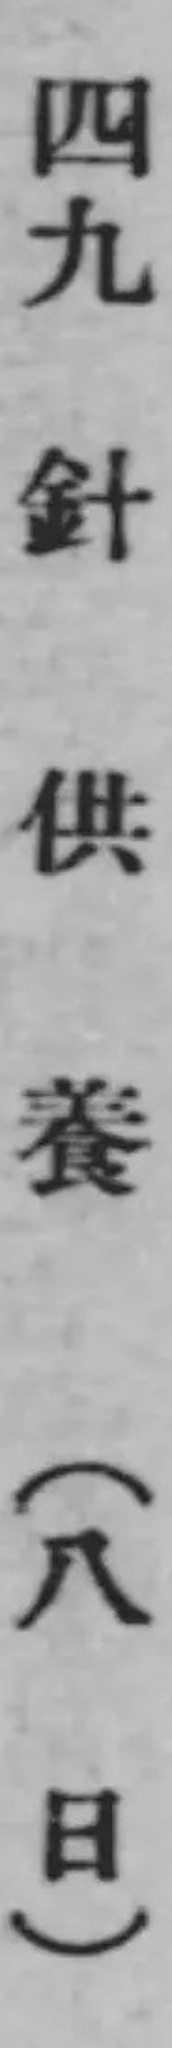四九針供養(八日)
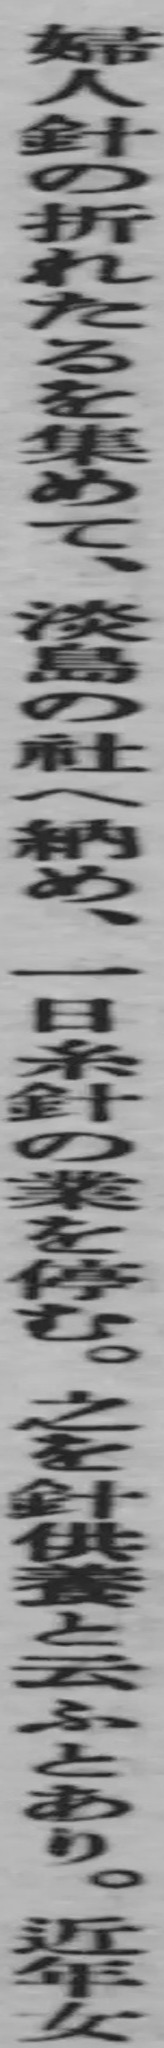婦人針の折れたるを集めて、淡島の社へ納め、一日糸針の業を停む。之を針供養と云ふとあり。近年女
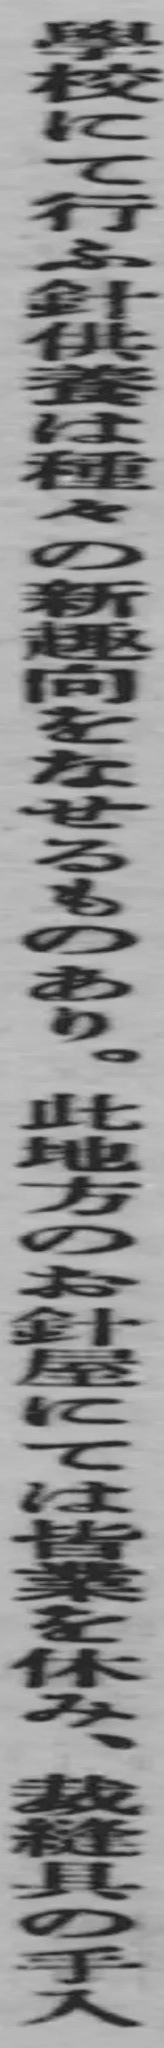學校にて行ふ針供養は種々の新趣向をなせるものあり、此地方のお針屋にては皆業を休み、裁縫具の手入
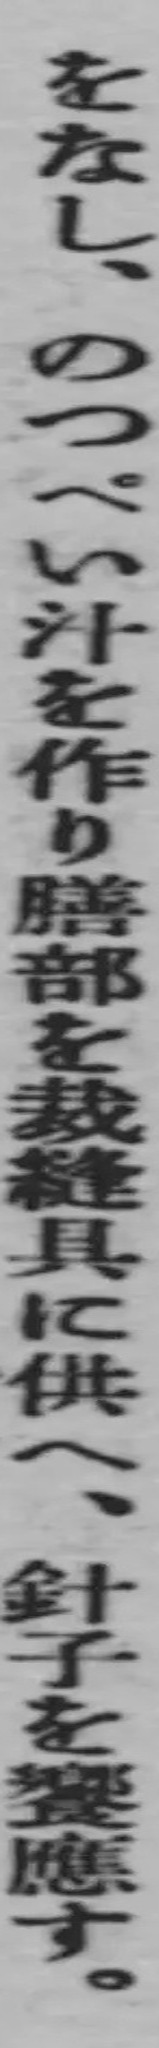をなし、のつぺい汁を作り膳部を裁縫具に供へ、針子を饗應す。
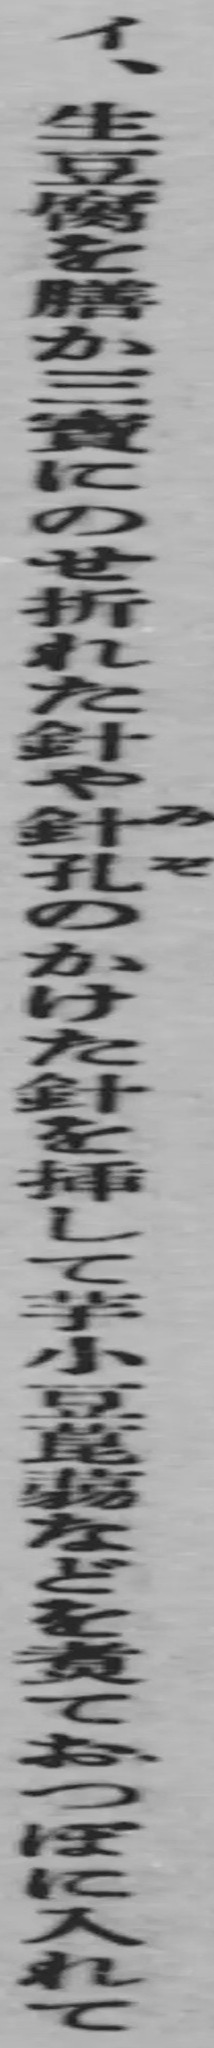イ、生豆腐を膳か三寶にのせ折れた針や針孔のかけた針を挿して芋小豆菎蒻などを煑ておつぼに入れて
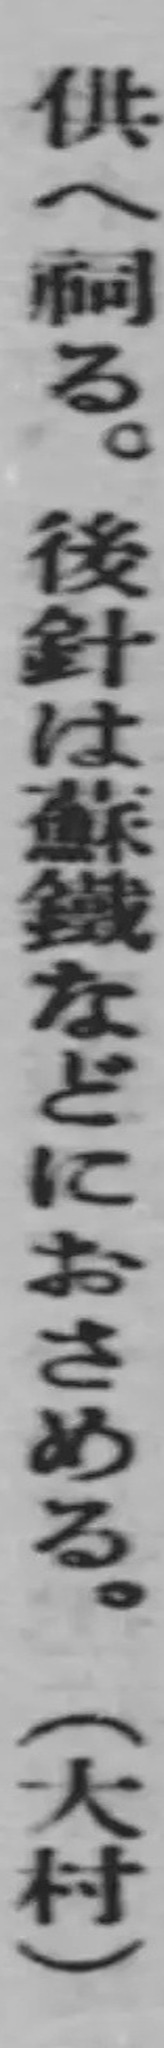供へ祠る。後針は蘇鐵などにおさめる。(大村)
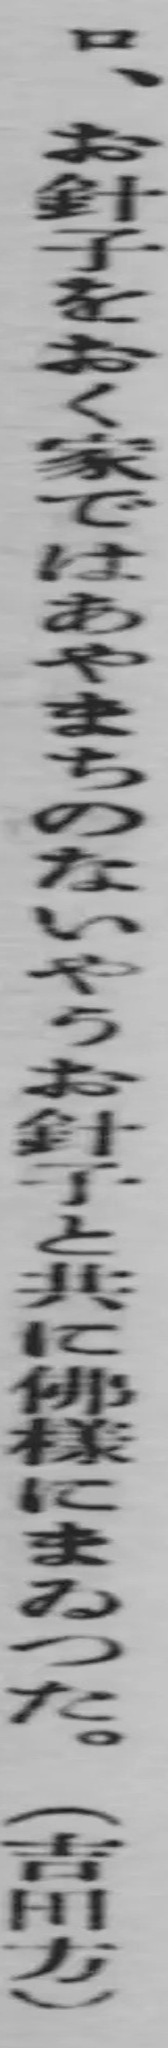ロ、お針子をおく家ではあやまちのないやうお針子と共に佛様にまゐつた。(吉田方)
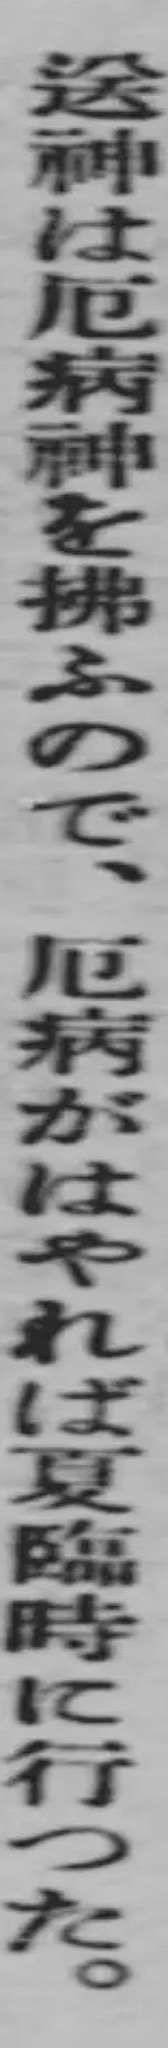送神は疫病神を拂ふので、疫病がはやれば夏臨時に行つた。
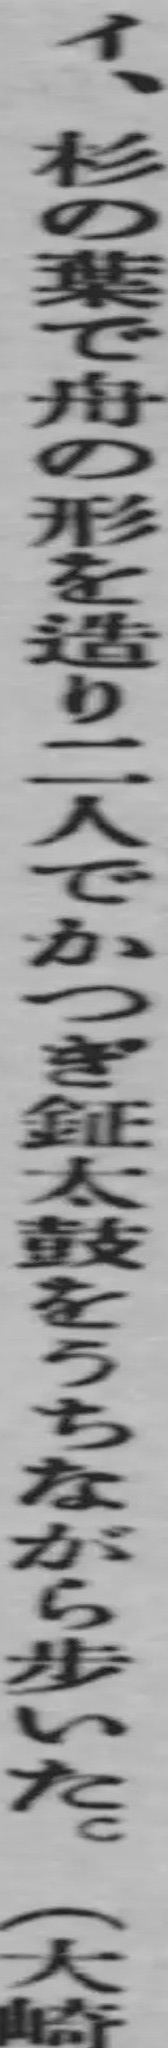イ、杉の葉で舟を造り二人でかつぎ鉦太鼓をうちながら歩いた。(大崎)
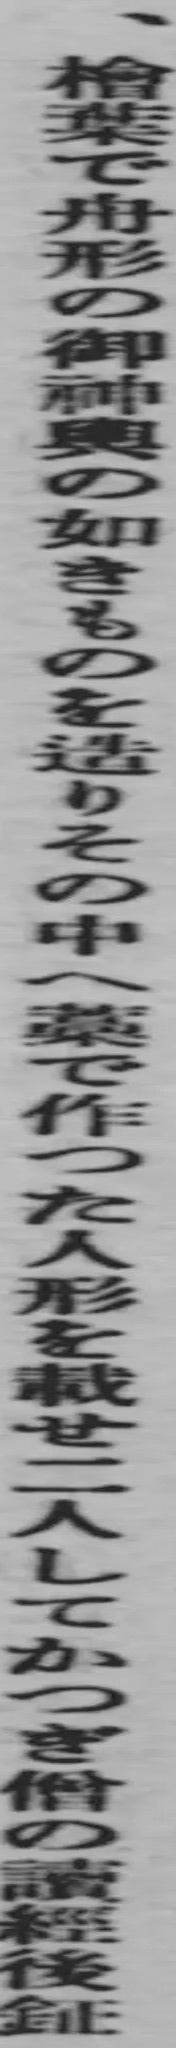ロ、檜葉で舟形の御神輿の如きものを造りその中へ藁で作つた人形を載せ二人してかつぎ僧の讀經後鉦
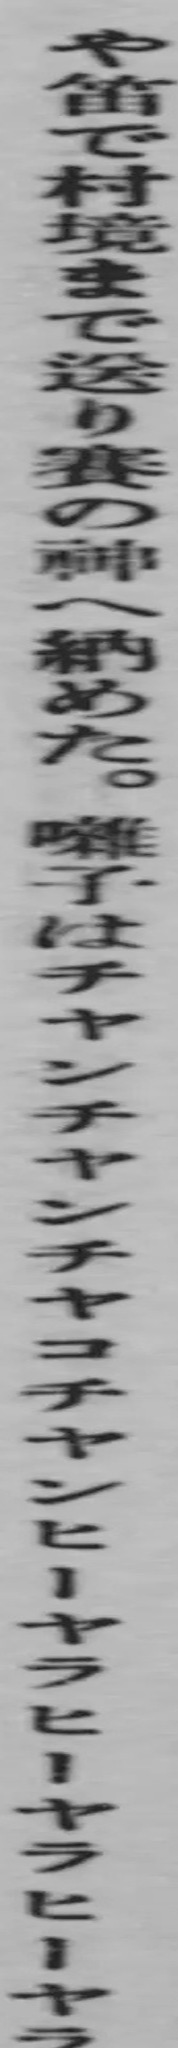や笛で村境まで送り賽の神へ納めた。囃子はチヤンチヤンチヤコチヤンヒーヤラヒーヤラヒーヤラ
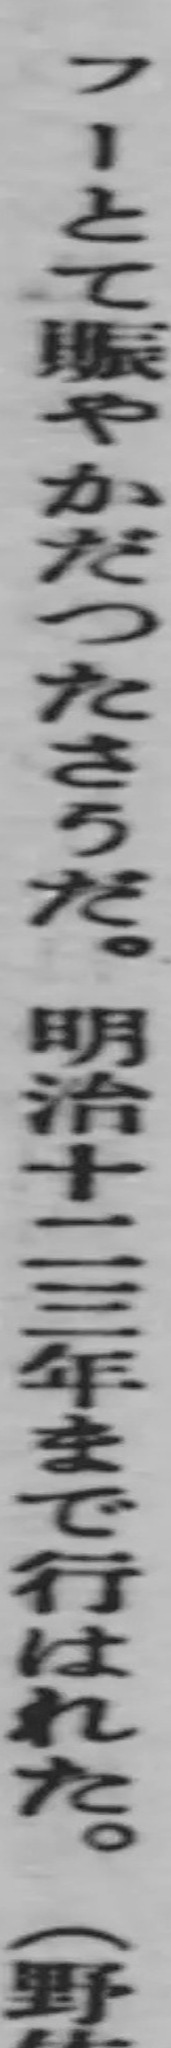フーとて賑やかだつたさうだ。明治十二三年まで行はれた。(野依)
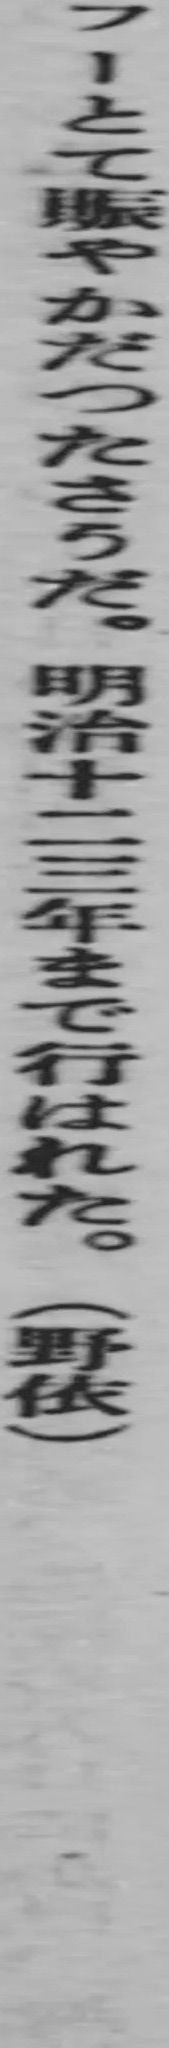フーとて賑やかだつたさうだ。明治十二三年まで行はれた。(野依)
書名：豊橋の年中行事
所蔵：国立国会図書館 National Diet Library, JAPAN
